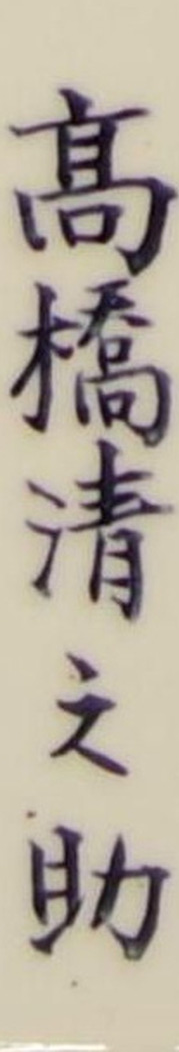高橋清之助
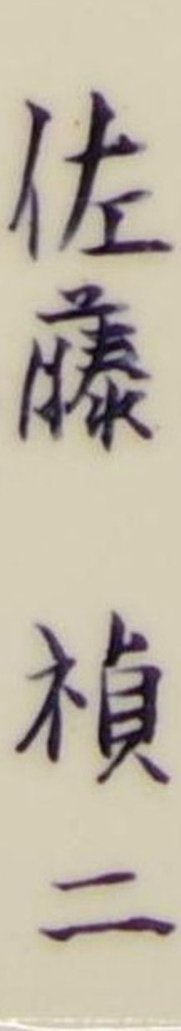佐藤禎二
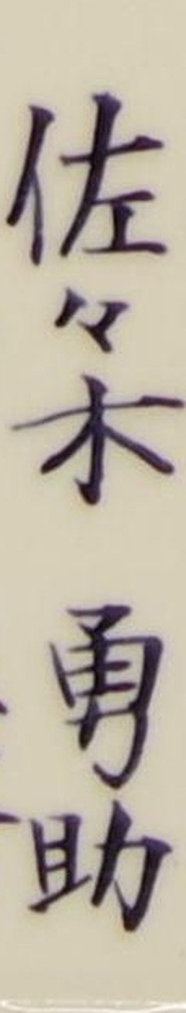佐々木勇助
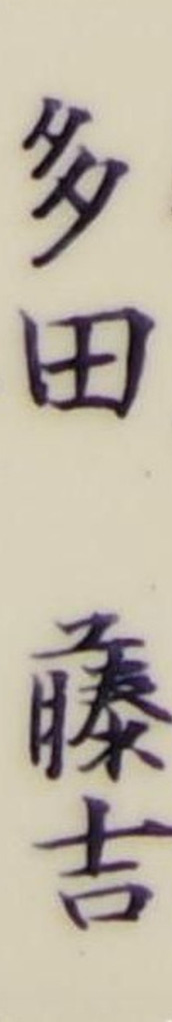多田藤吉
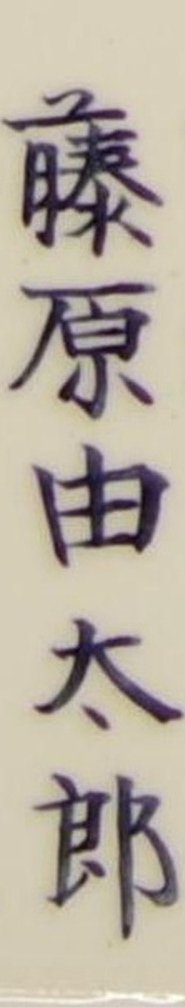藤原由太郎
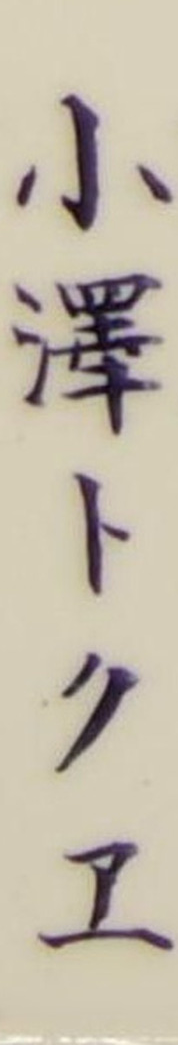小沢トクヱ
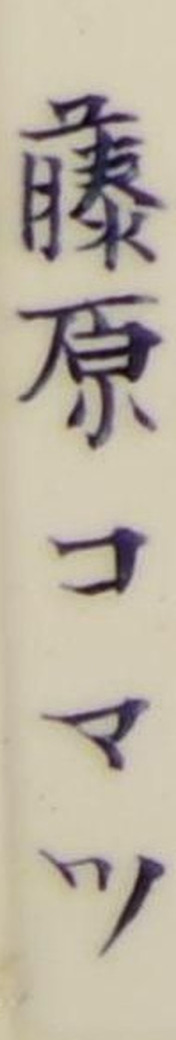藤原コマツ

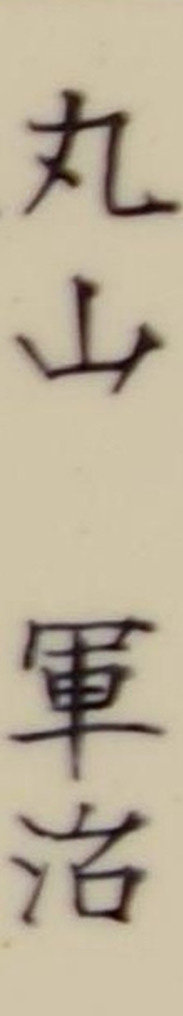丸山軍治
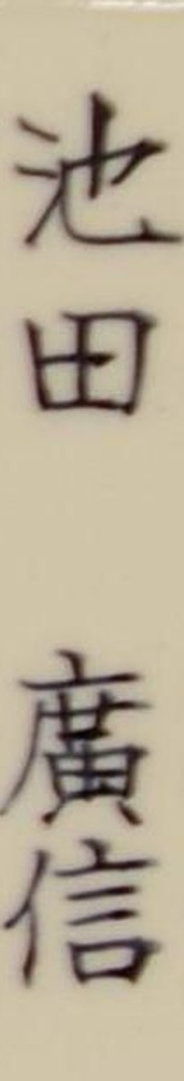池田広信
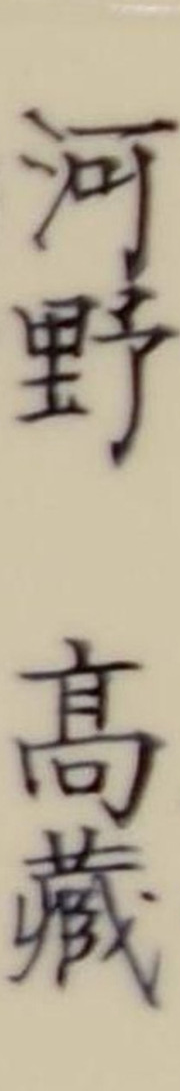河野高蔵
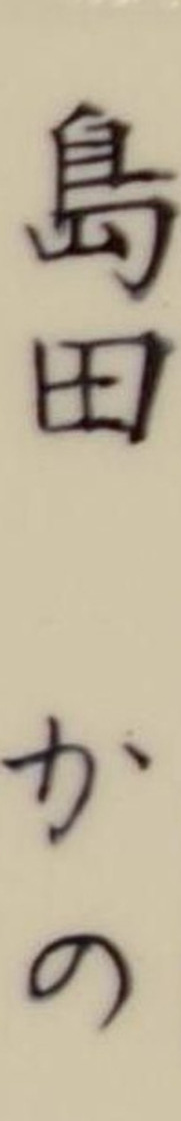島田かの
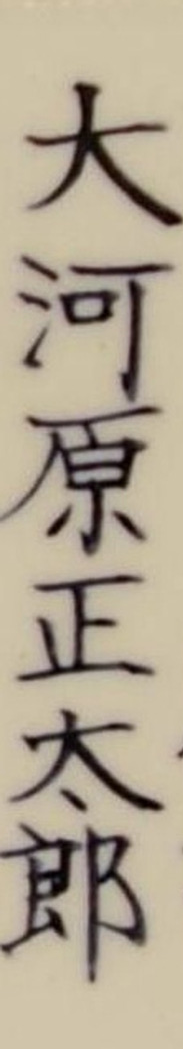大河原正太郎
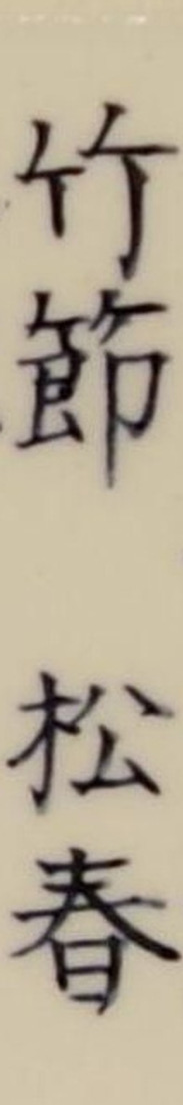竹節松春
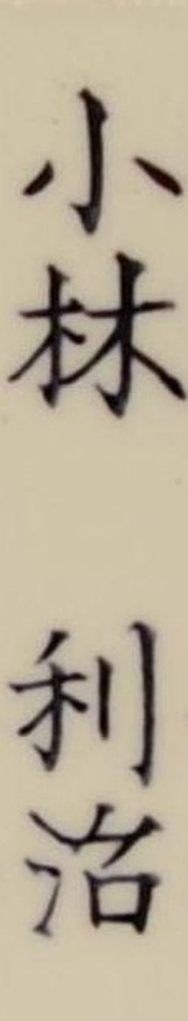小林利治
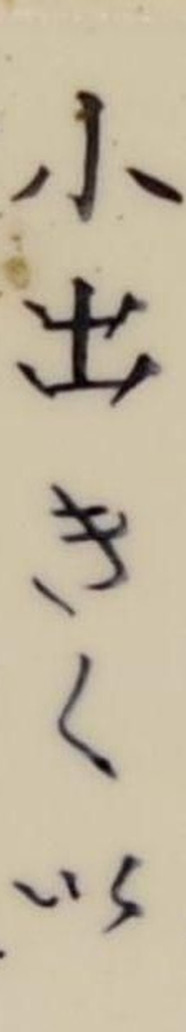小出きくい
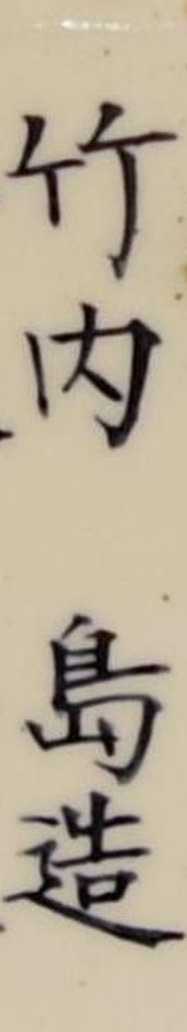竹内島造
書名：A~D
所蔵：koyasan kongobuji
